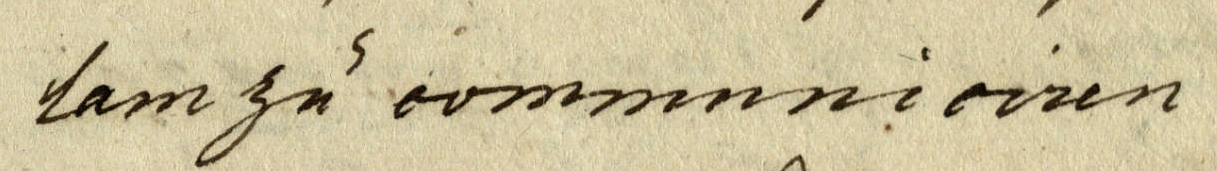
lam zu communiciren.
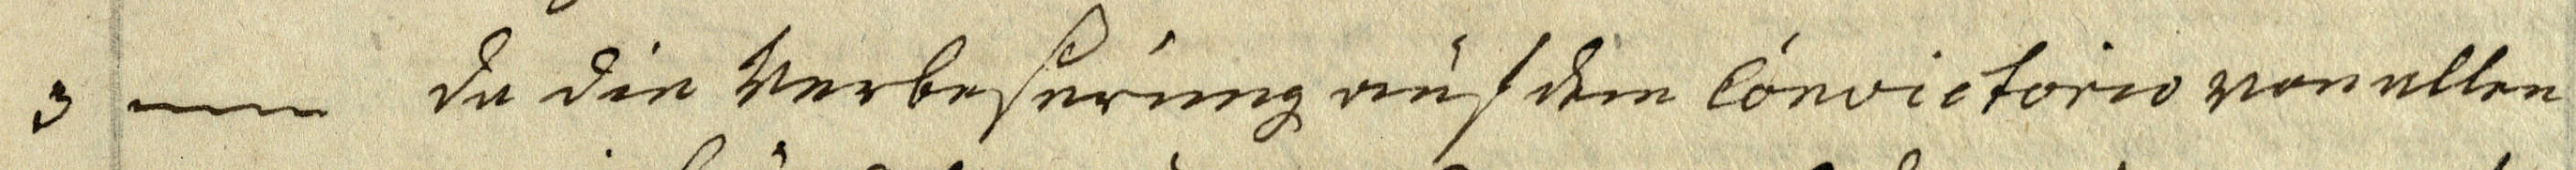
3. Da die Verbeßerung auf dem Convictorio von allen
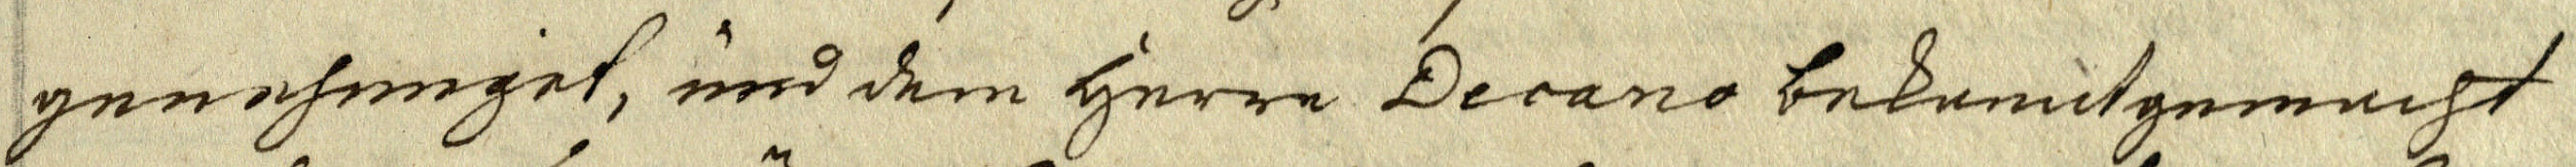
genehmiget, und dem Herrn Decano bekannt gemacht
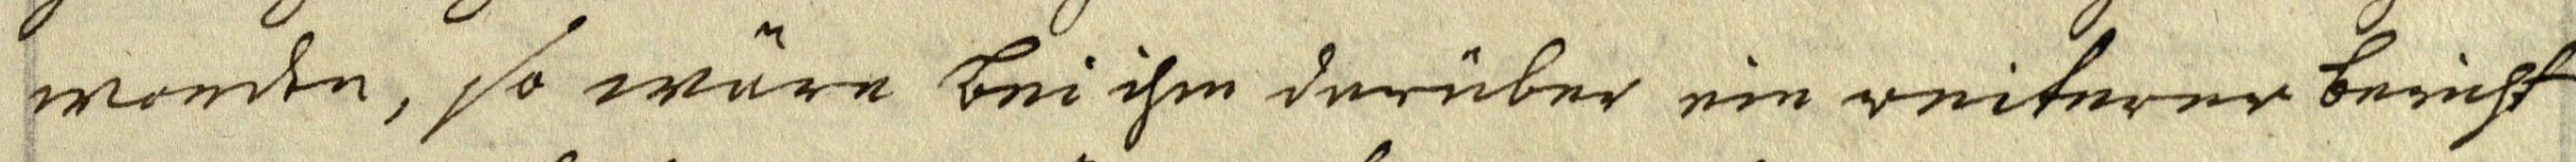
worden, so wäre bei ihm darüber ein weiterer Bericht
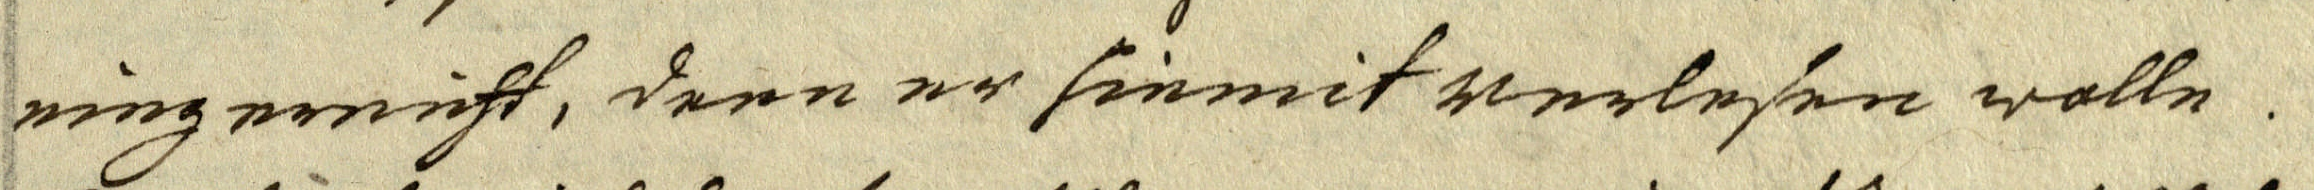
eingereicht, den n er hiemit verlesen wolle.
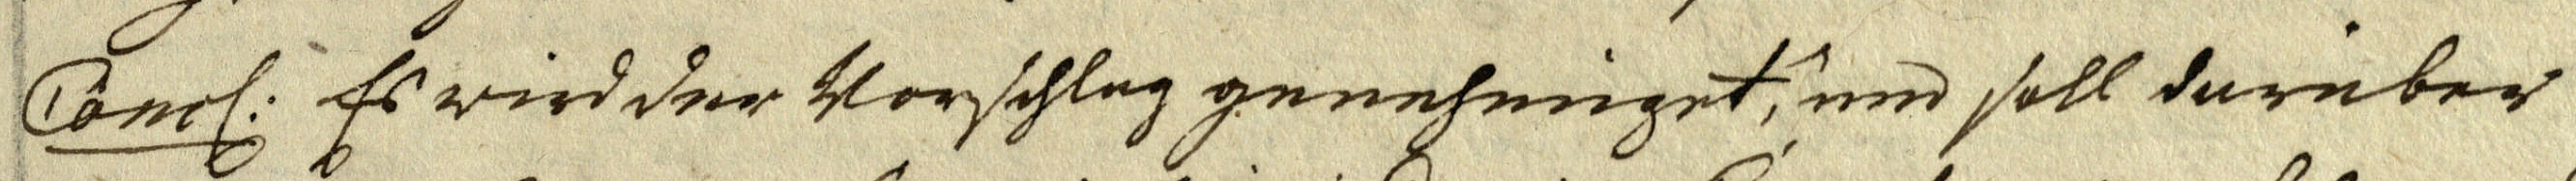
Concl. Es wird der Vorschlag genehmiget, und soll darüber
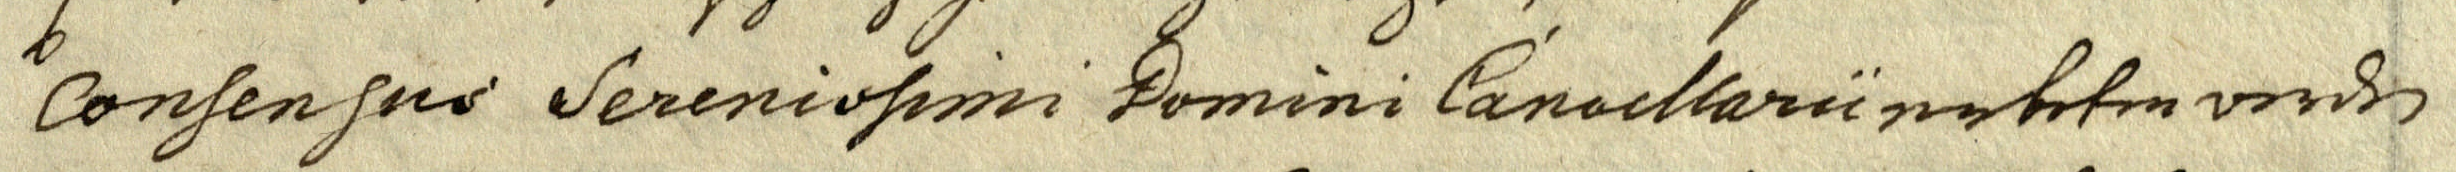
Consensus Serenissimi Domini Cancellarii erbeten werden.
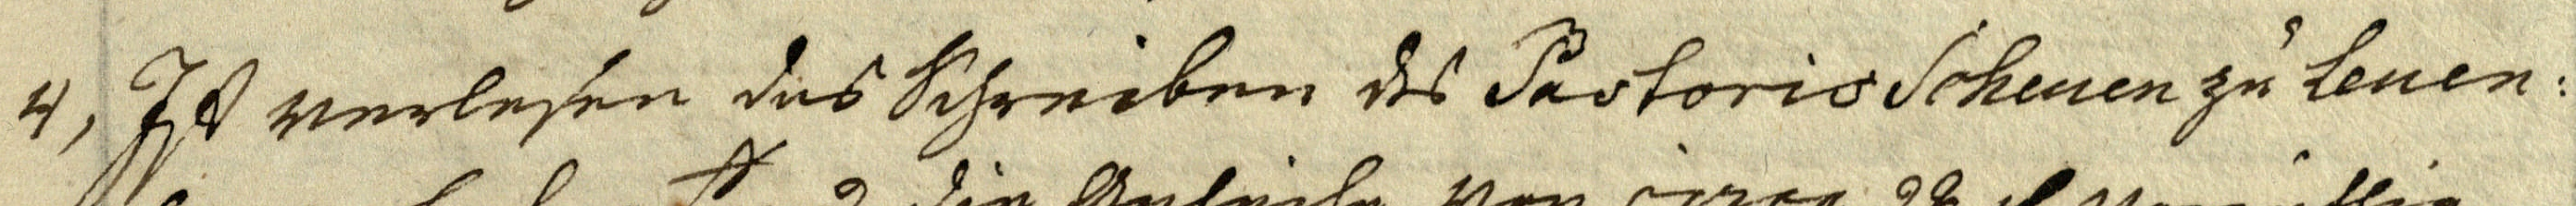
4, Ist verlesen das Schreiben des Pastoris Scheven zu Leven¬
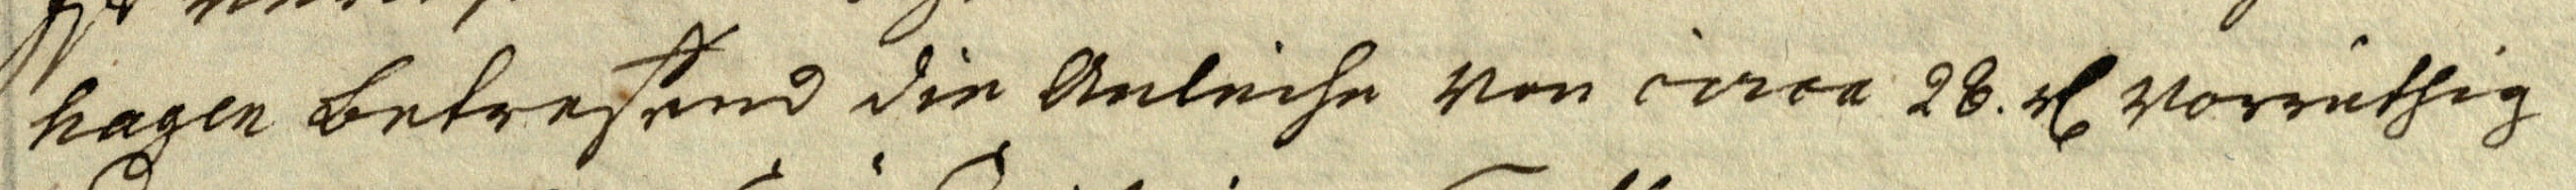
hagen betreffend die Anleihe von circa 28 rl. vorräthig
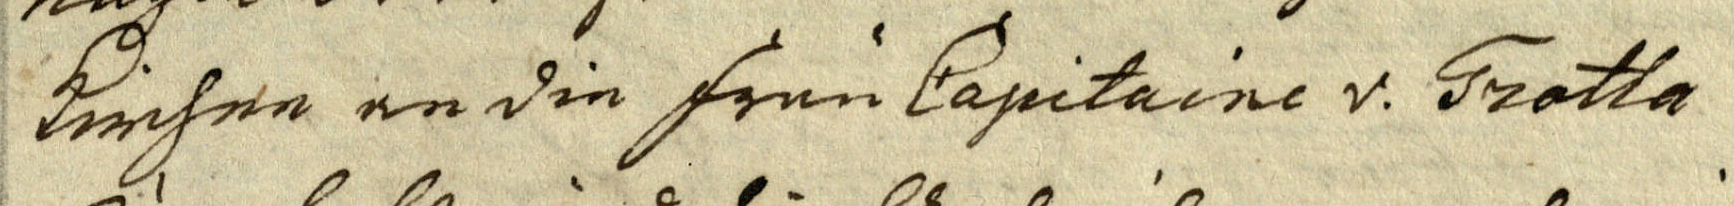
Kirchen an die Frau Capitaine v. Trotta.
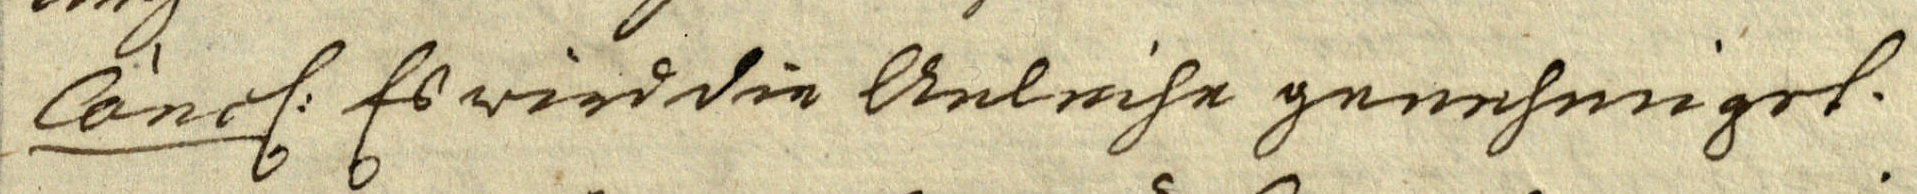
Concl. Es wird die Anleihe genehmiget.
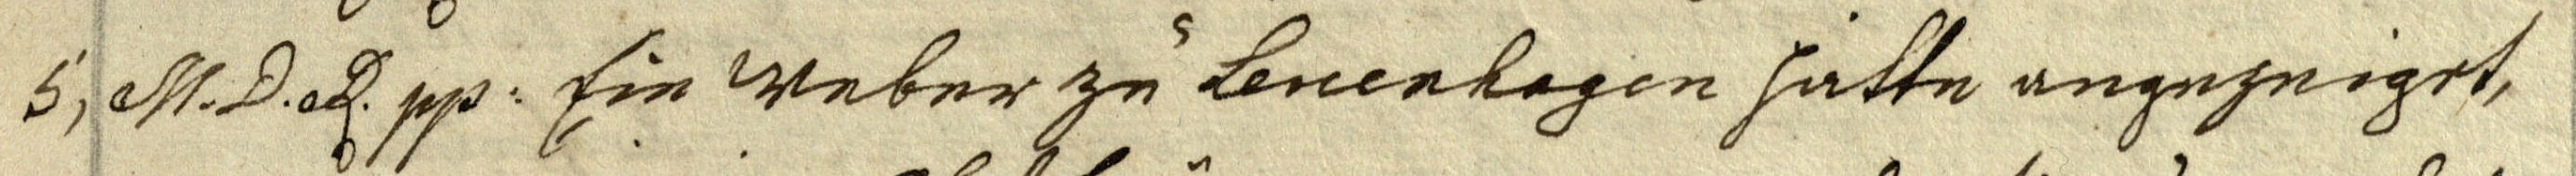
5, M. D. R. pp. Ein Weber zu Levenhagen hätte angezeiget,
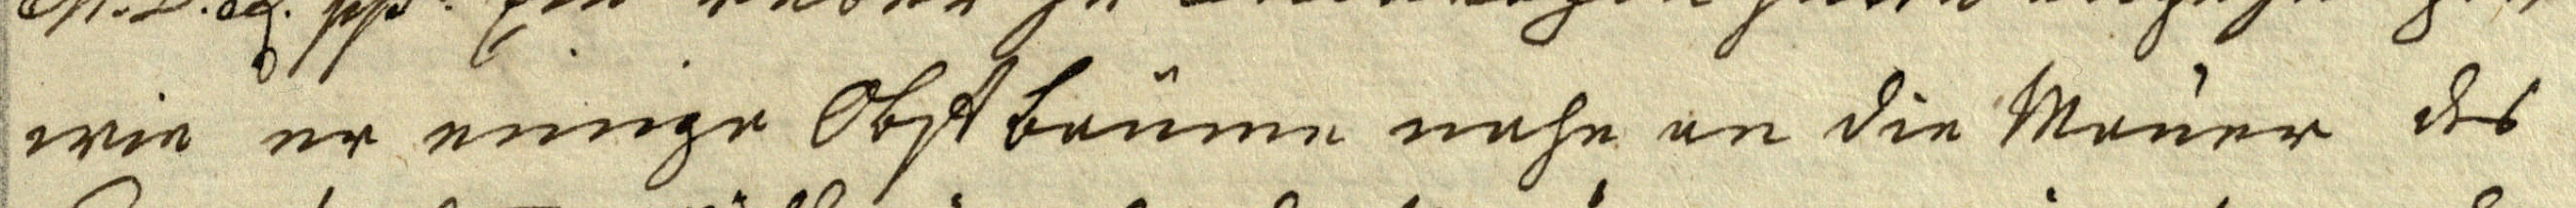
wie er einige Obstbäume nahe an die Mauer des
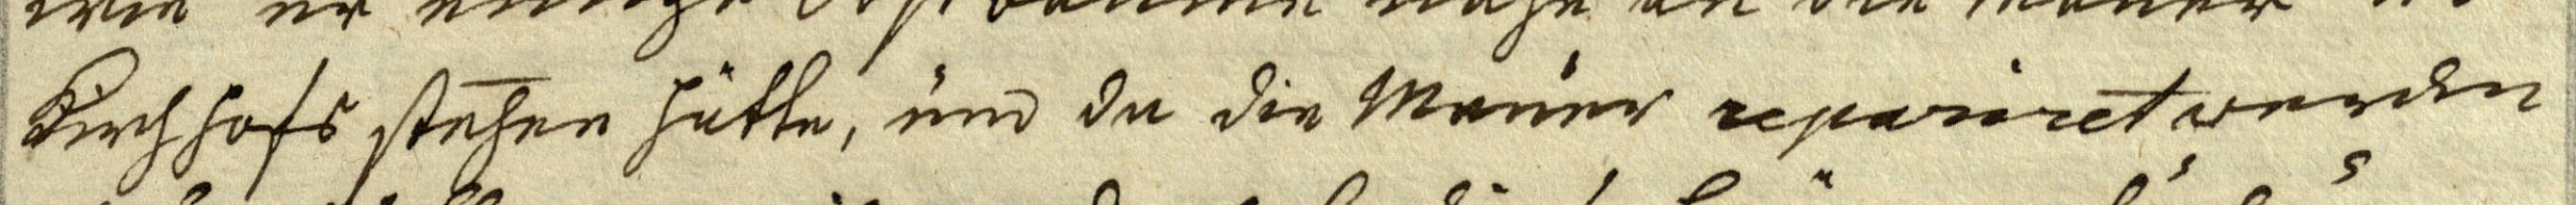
Kirchhofs stehen hätte, und da die Mauer repariret werden
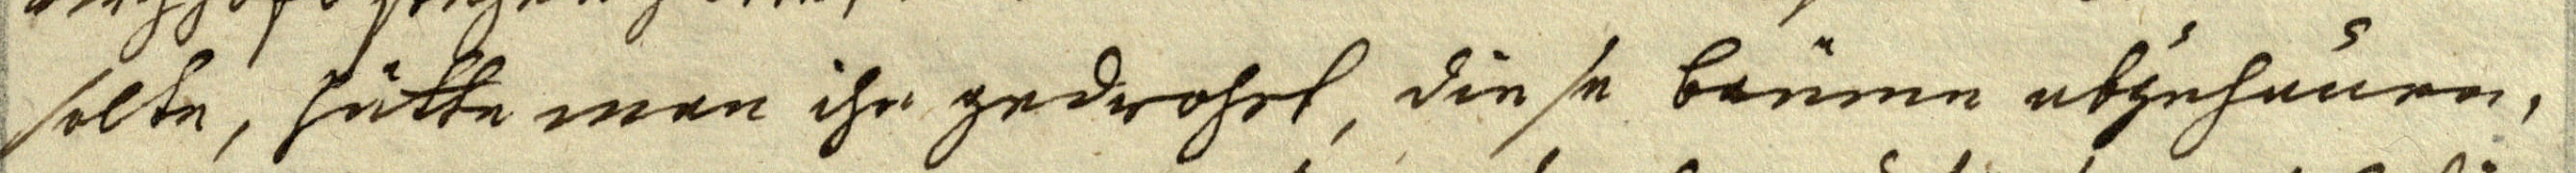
solte, hätte man ihn gedrohet, diese Bäume abzuhauen,
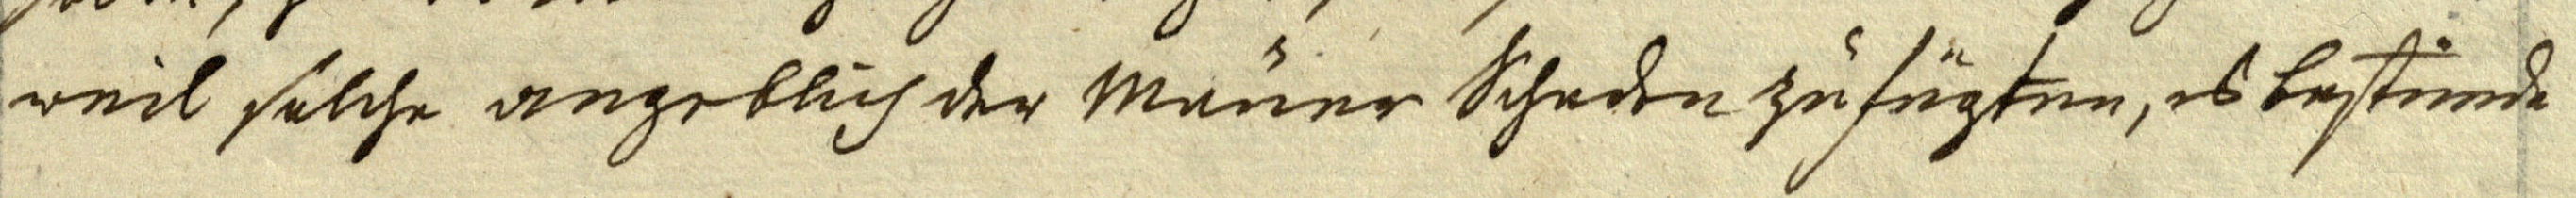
weil solche angeblich der Mauer Schaden zufügten, es bestünde
